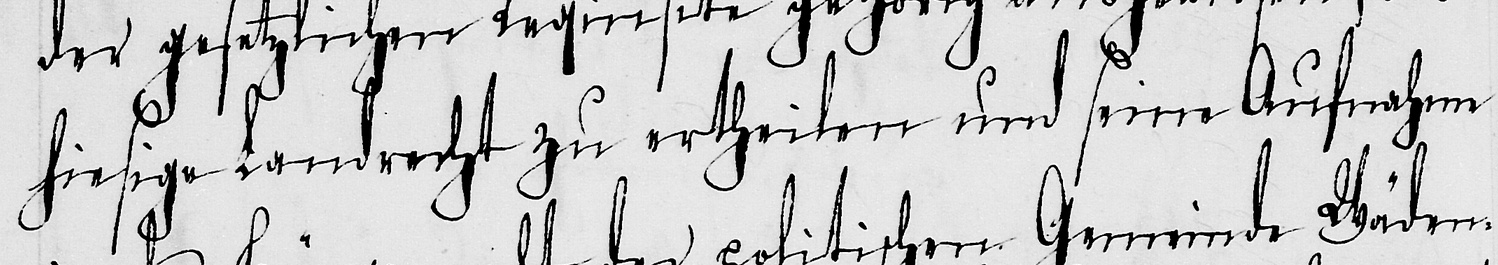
hiesige Landrecht zu ertheilen und seine Aufnahme
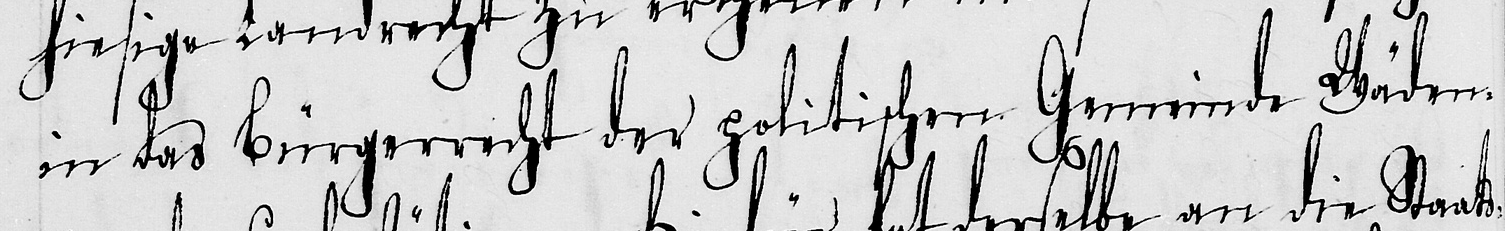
in das Bürgerrecht der politischen Gemeinde Wäden¬
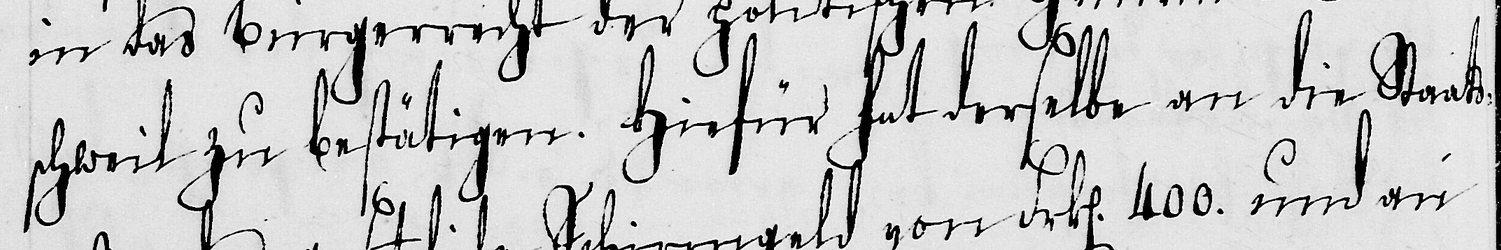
chweil zu bestätigen. Hiefür hat derselbe an die Sta¬
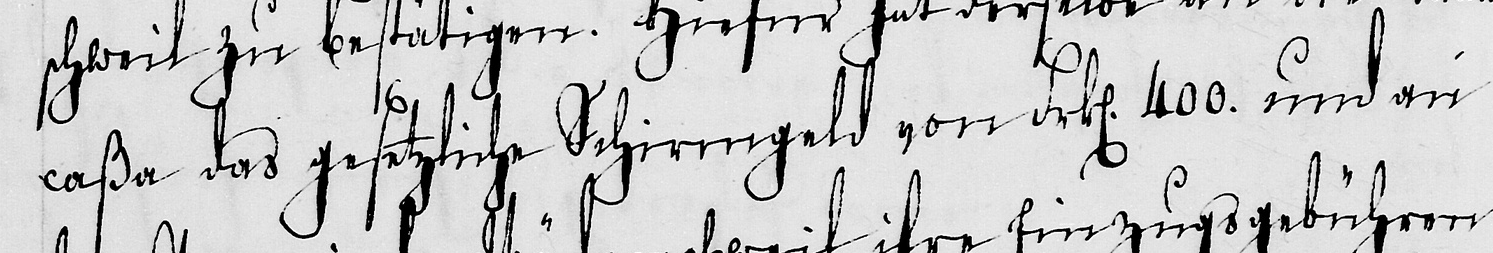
scaßa das gesetzliche Schirmgeld von Frk[en]. 400. und an
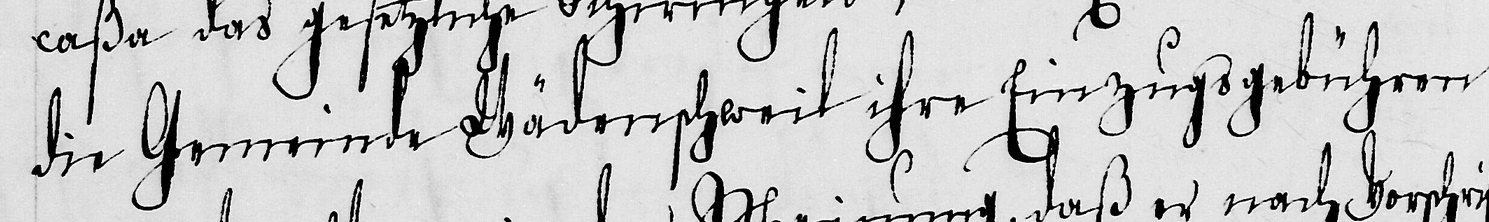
die Gemeinde Wädenschweil ihre Einzugsgebühren
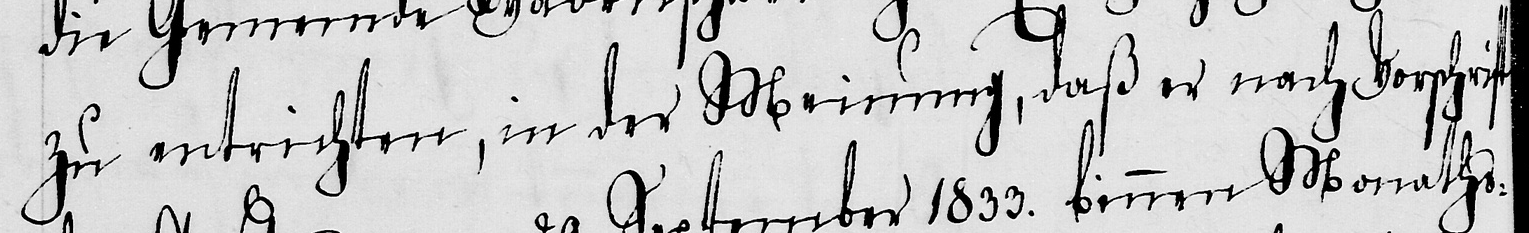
zu entrichten, in der Meinung, daß er nach Vorschri¬
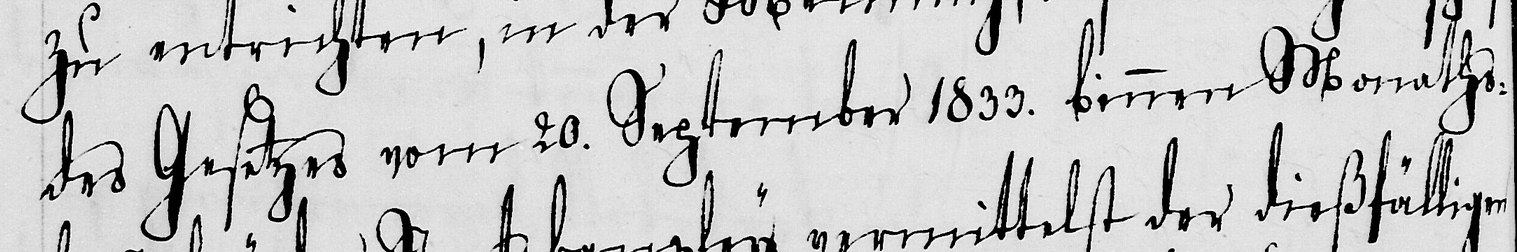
des Gesetzes vom 20. September 1833. binnen Monaths¬
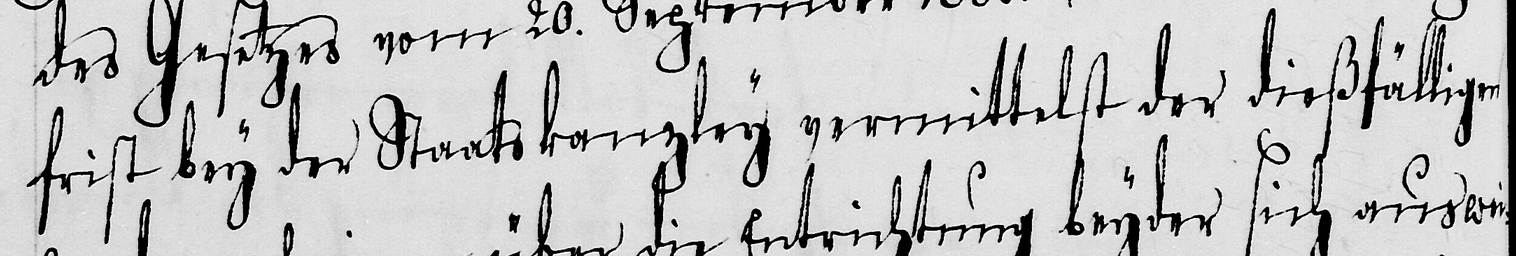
frist bey der Staatskanzley vermittelst der dießfällig¬
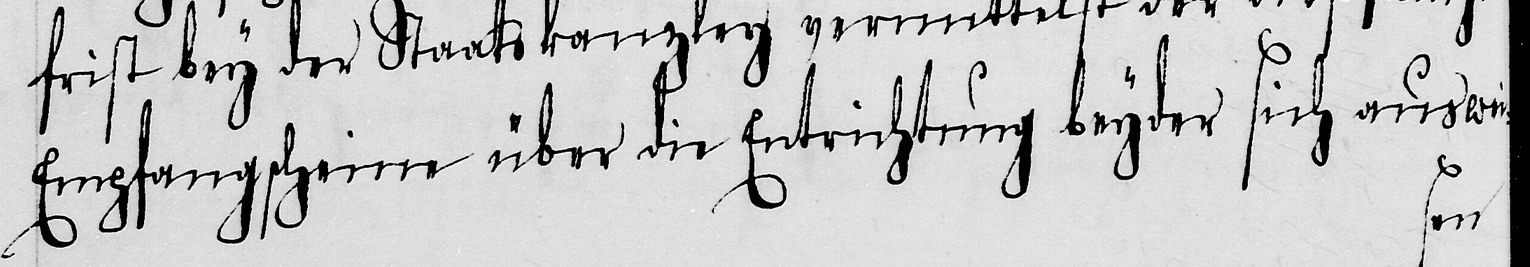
Empfangscheine über die Entrichtung beyder sich auswe¬
